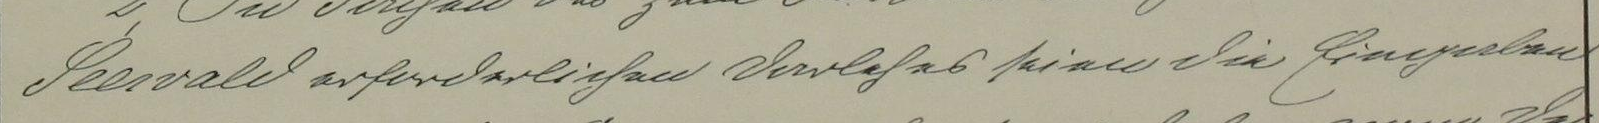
Seewald erforderlichen Darlehns seien die Eingaben
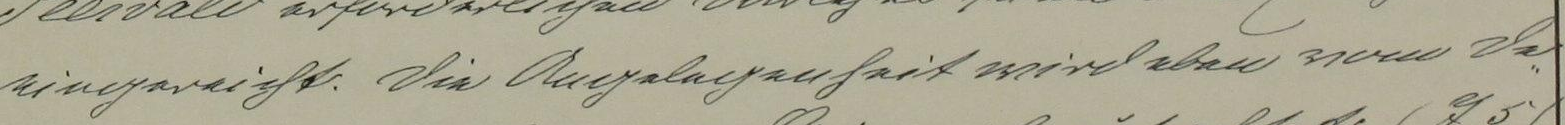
eingereicht. Die Angelegenheit wird eben vom De-
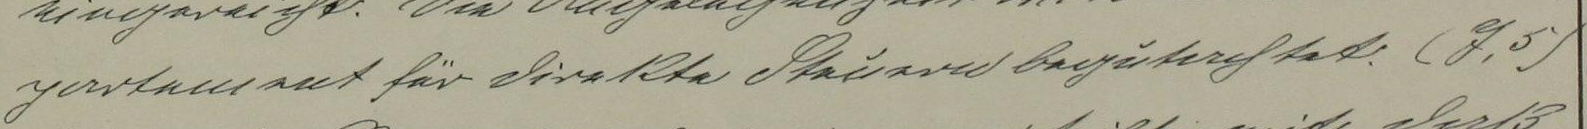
partement für direkte Steuern begutachtet. (I.5)
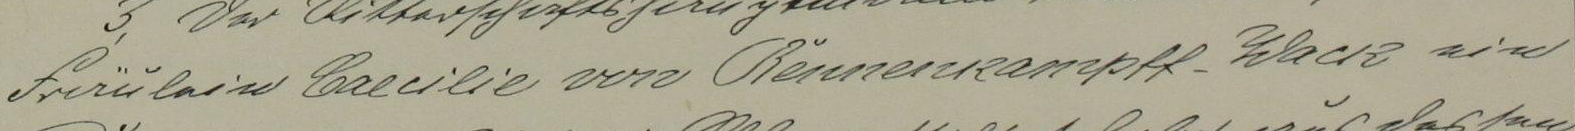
Fräulein Caecilie von Rennenkampff-Wack ein
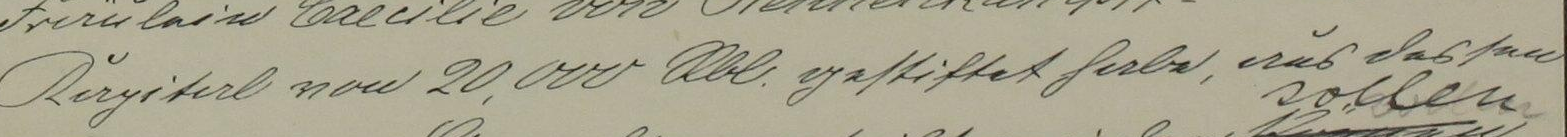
Kapital von 20.000 Rbl. gestiftet habe, aus dessen
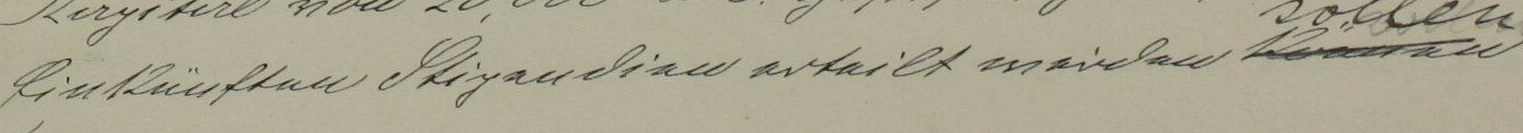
Einkünften Stipendien erteilt werden können
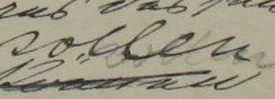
sollen
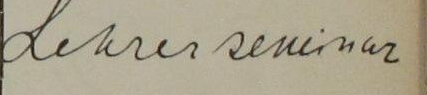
Lehrerseminar
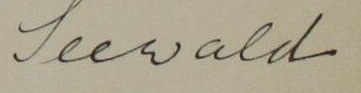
Seewald
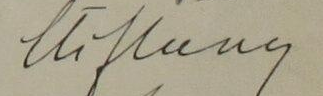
Stiftung
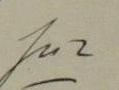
für
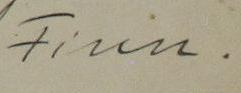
Finn
